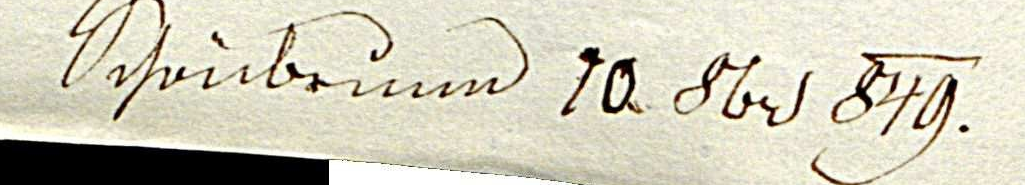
Schönbrunn 10. 8ber 849 [clear from context this means October, not August]
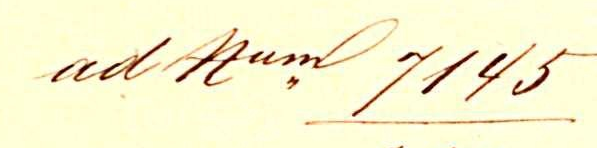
ad Num. 7145/
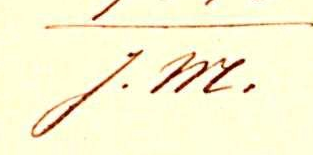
JM
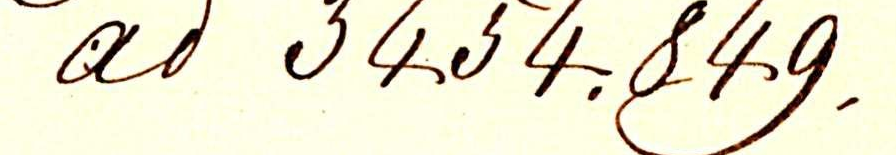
ad 3454. 849
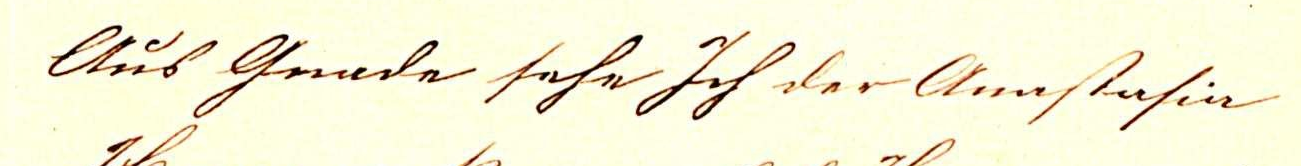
Aus Gnade sehe Ich der Anastasia
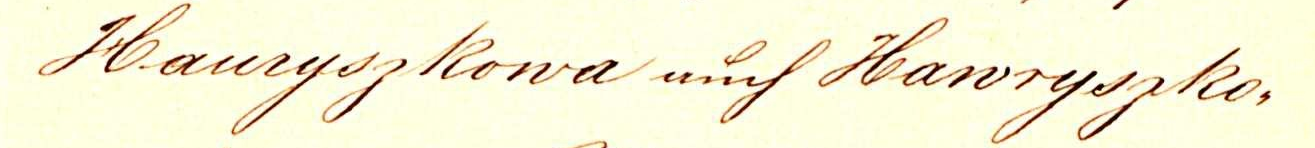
Hauryszkowa, auch Hawryszko¬
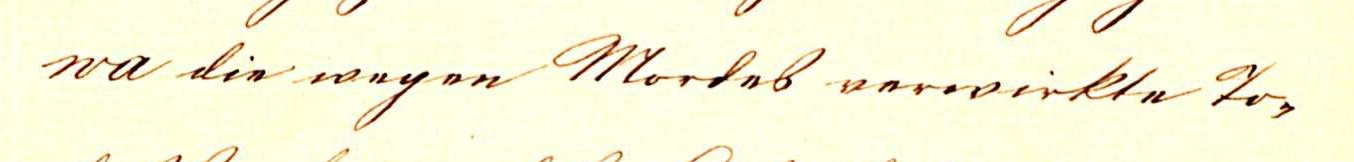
wa, die wegen Mordes verwirkte To¬
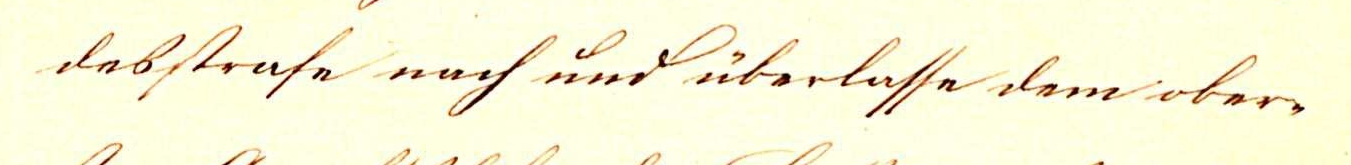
desstrafe nach und überlasse dem ober¬
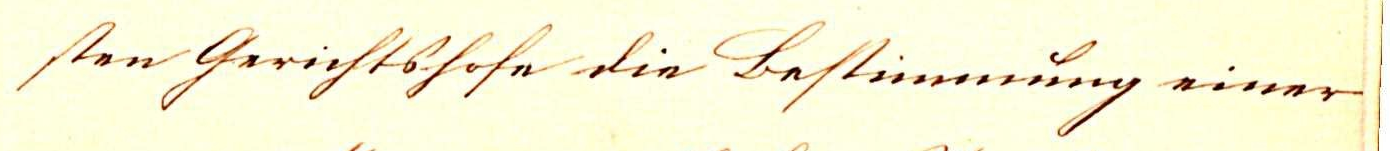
sten Gerichtshofe die Bestimmung einer
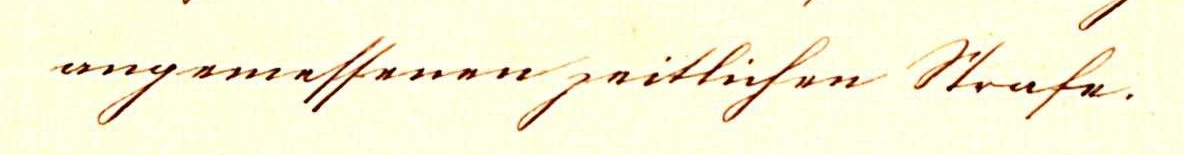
angemessenen zeitlichen Strafe.
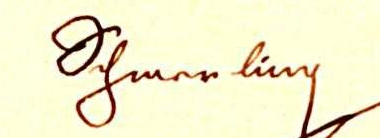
Schmerling
